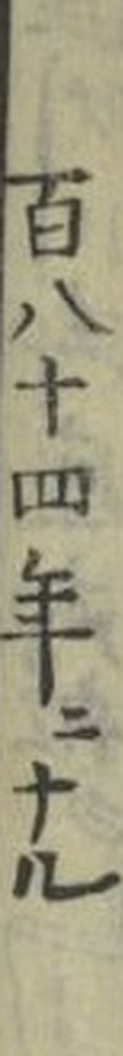百八十四年ニナル
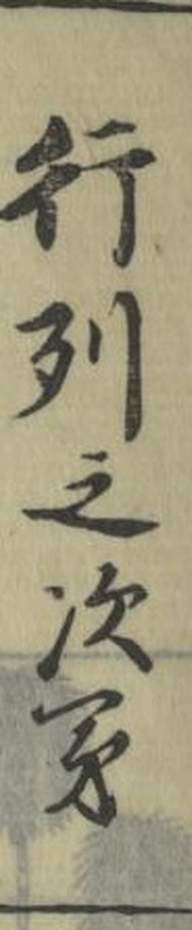行列之次第
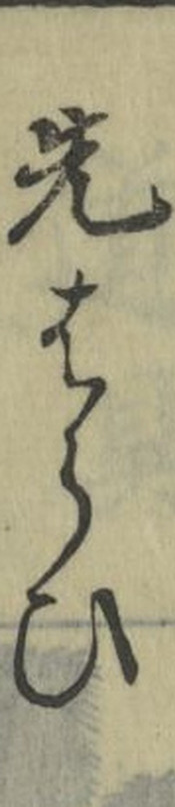先はらひ

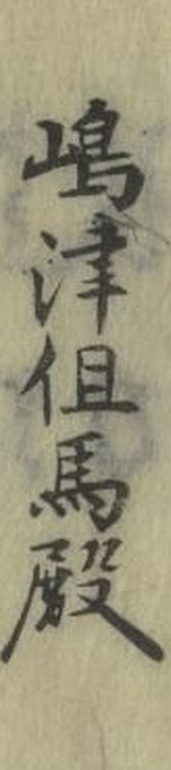島津但馬殿
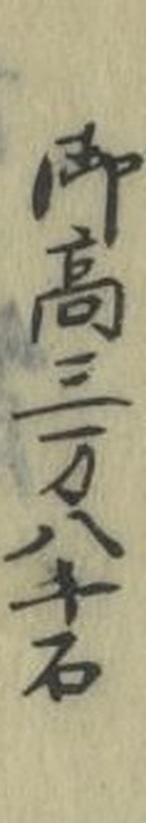御高三万八千石

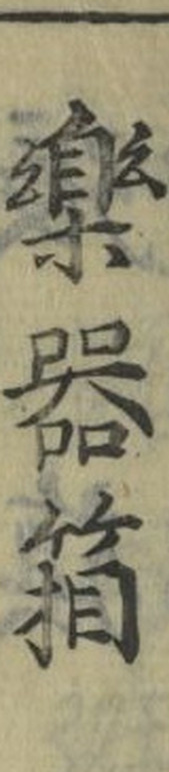樂器箱
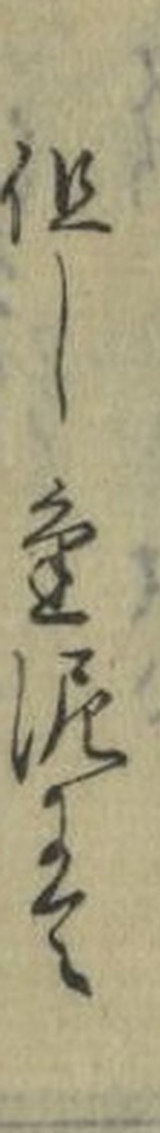但し金泥にて
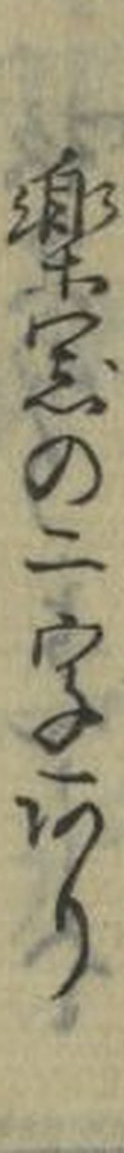樂器の二字あり
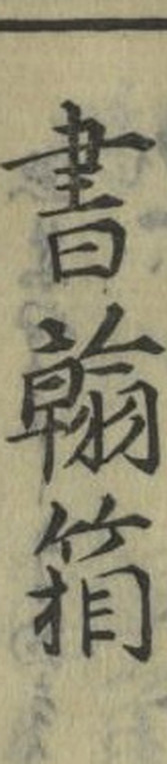書翰箱
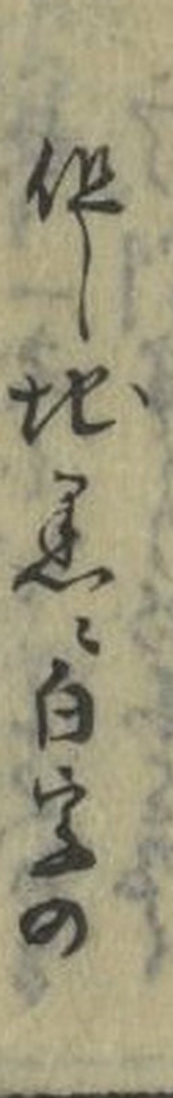但し地黒に白字の
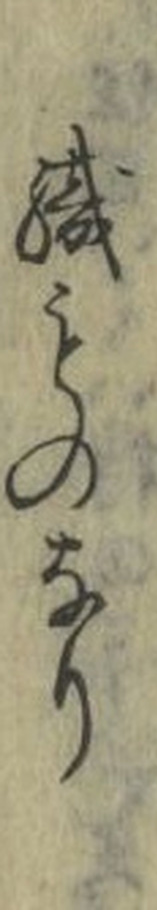織ものなり

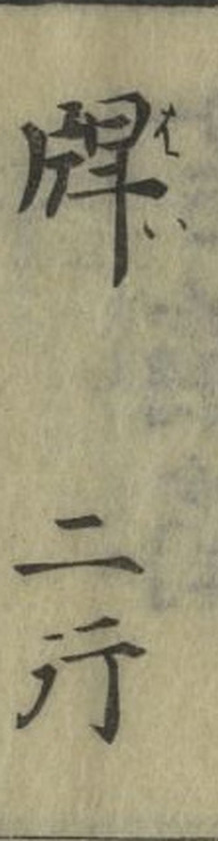牌二行
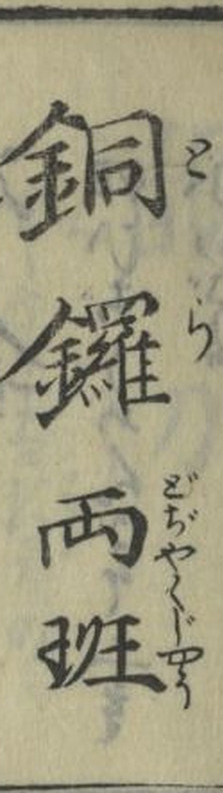銅鑼両班
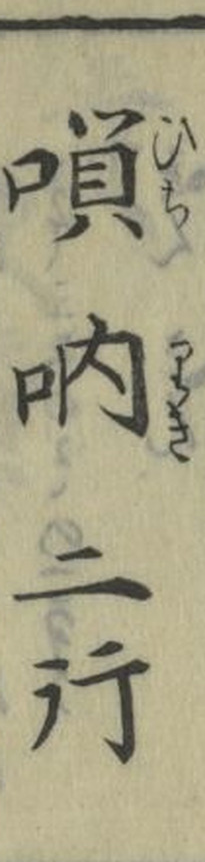嗩吶二行

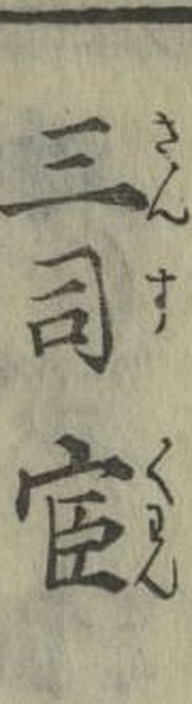三司宦
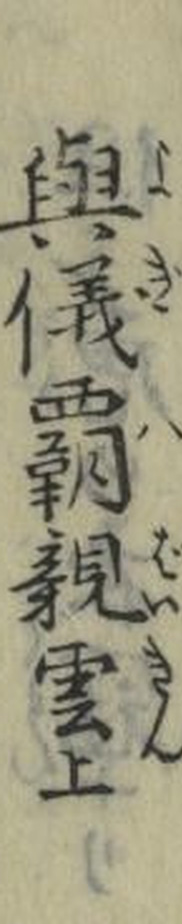與儀覇親雲上
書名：[琉球人行列記]
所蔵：University of the Ryukyus Library
